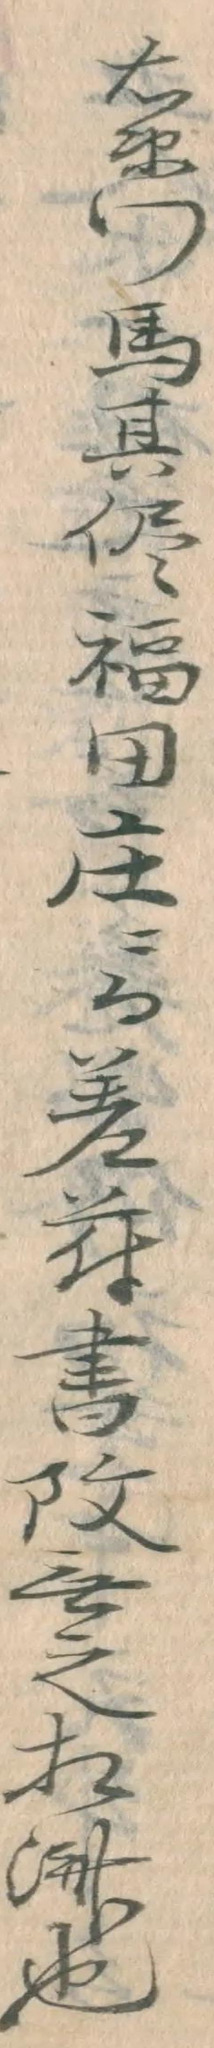右衛門馬其侭福田庄ニ而差苻書改無之相済也
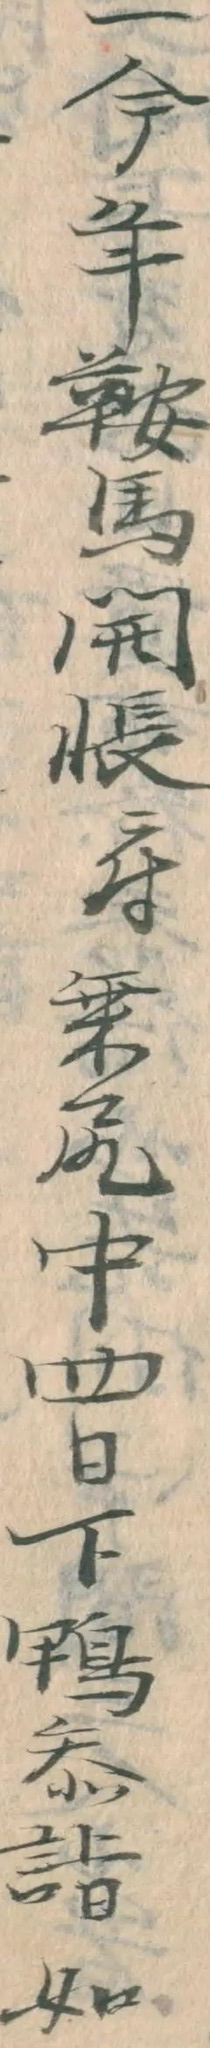一今年鞍馬開帳ニ付乗尻中四日下鴨参詣如
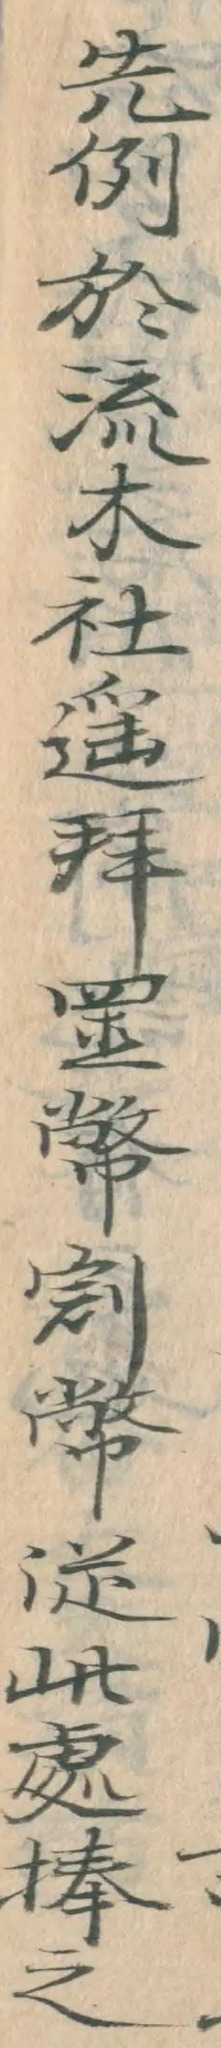先例於流木社遥拝置幣割幣従此処捧之

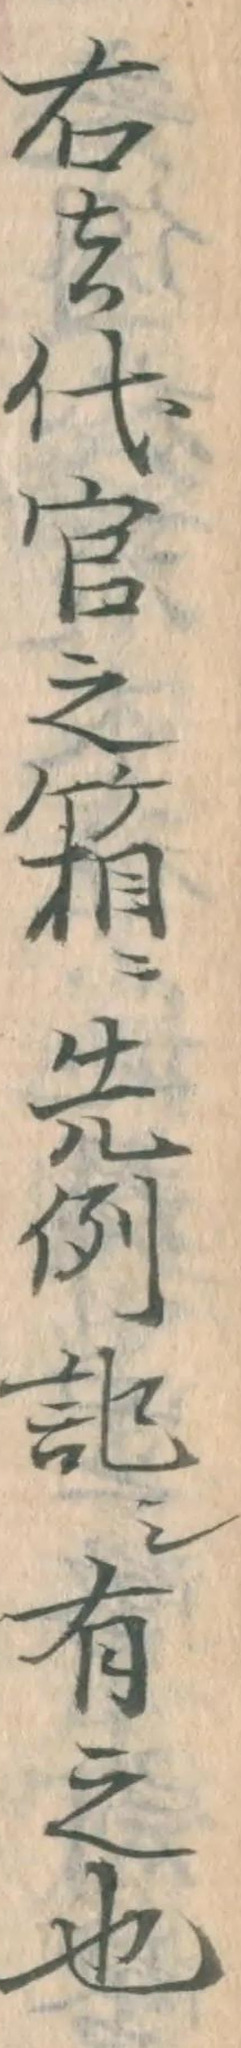右者代官之箱ニ先例記シ有之也
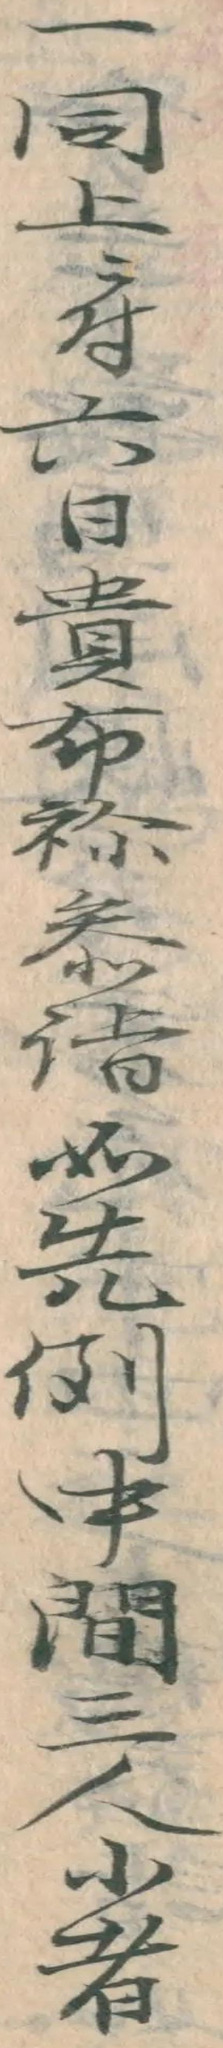一同上ニ付六日貴布祢参詣如先例中間三人小者
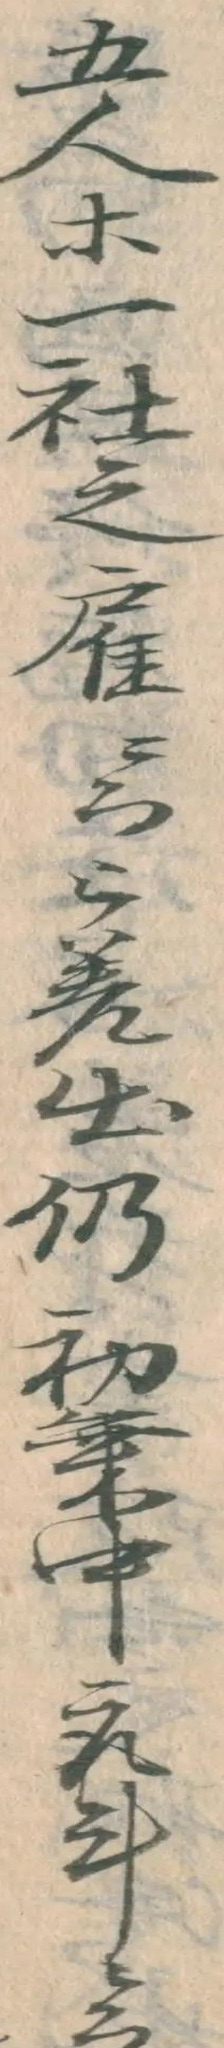五人等一社之雇ニ而被差出仍初乗中取計ニ而
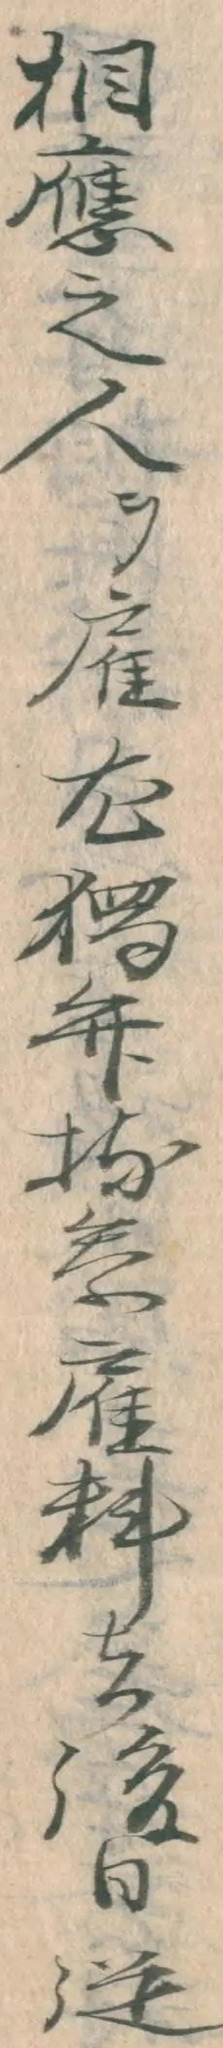相応之人ヲ雇尤独弁持参雇料者後日従
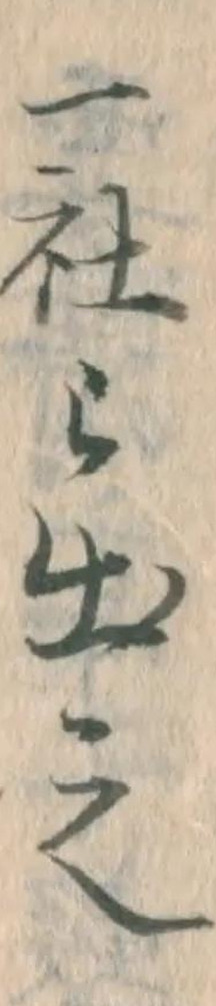一社被出之
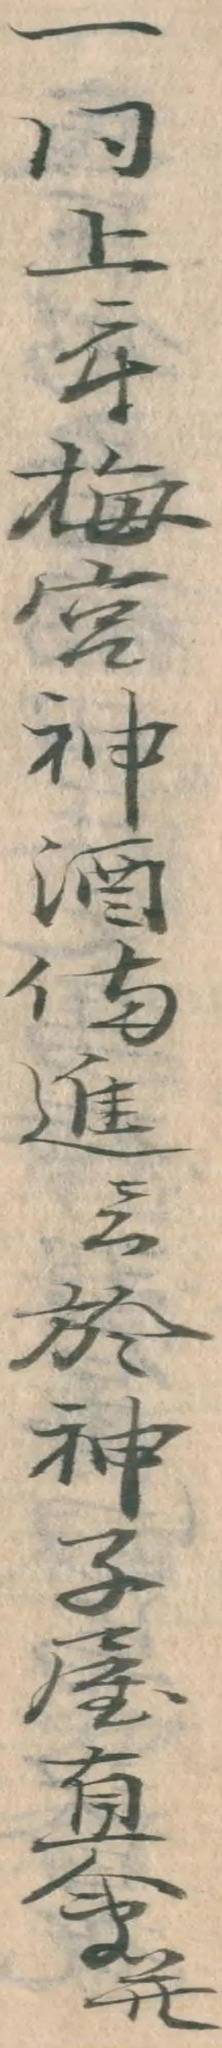一同上ニ付梅宮神酒備進ニ而於神子屋直会并
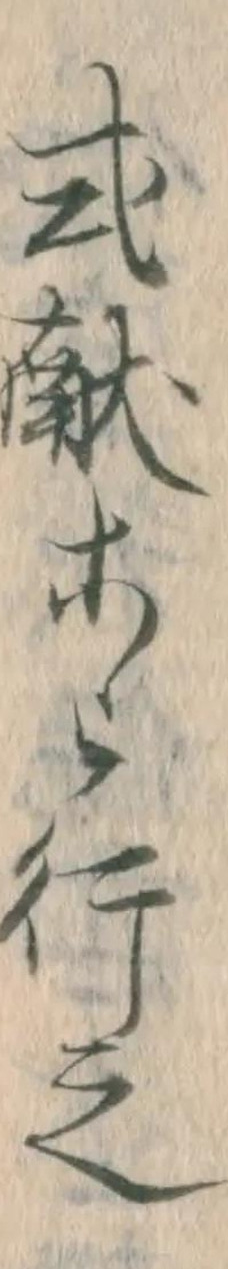式献等被行之
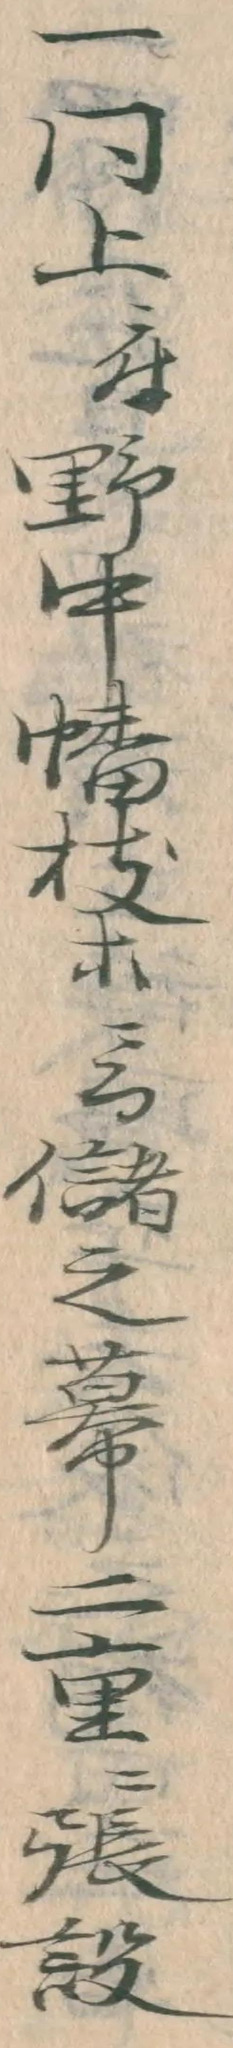一同上ニ付野中幡枝等ニ而儲之幕二重ニ張設
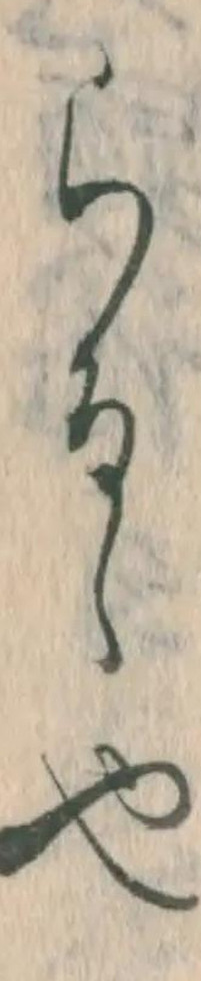らるゝ也
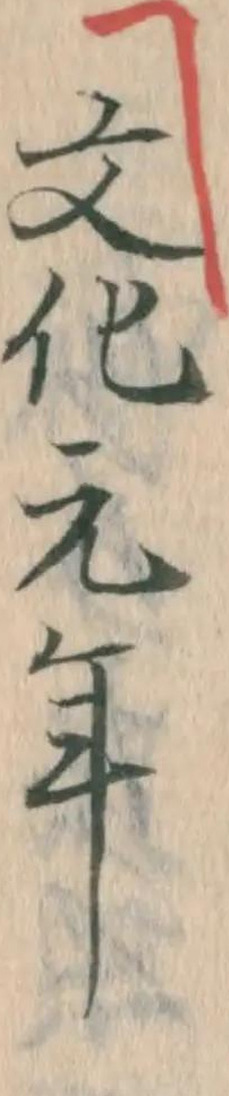文化元年
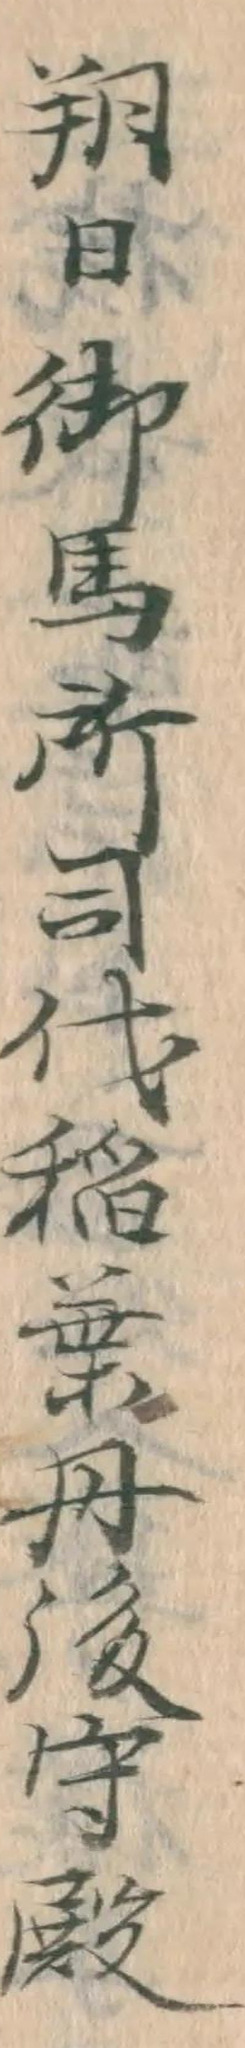朔日御馬所司代稲葉丹後守殿
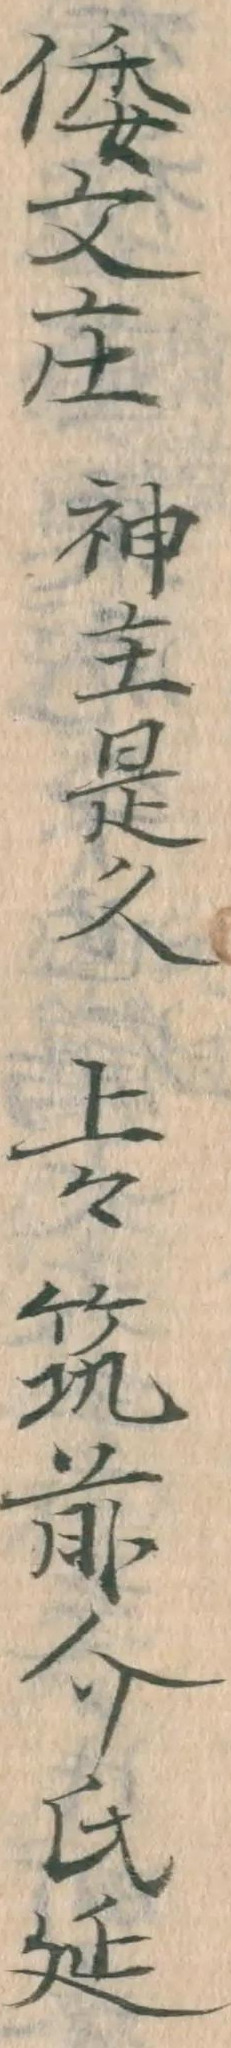倭文庄神主是久上々筑前介氏延
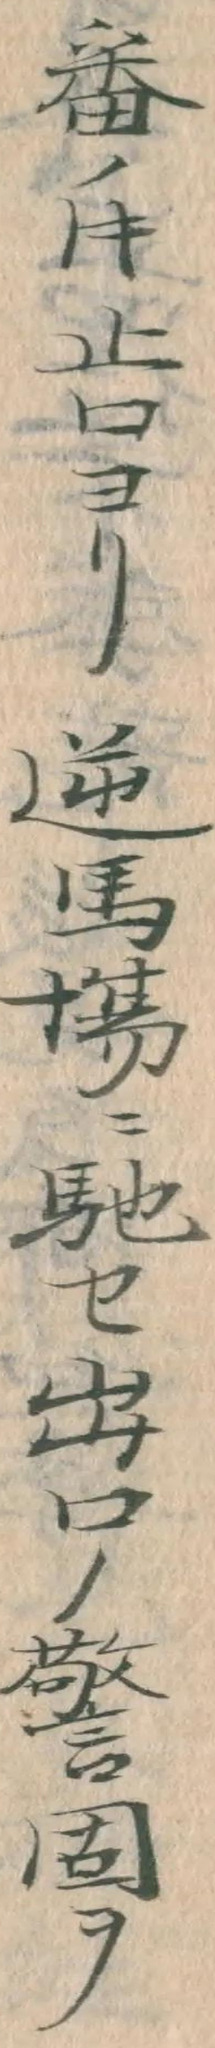番ノトキ止口ヨリ逆馬場ニ馳セ出口ノ警固ヲ
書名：賀茂社記録. 第10冊
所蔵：国立国会図書館 National Diet Library, JAPAN
